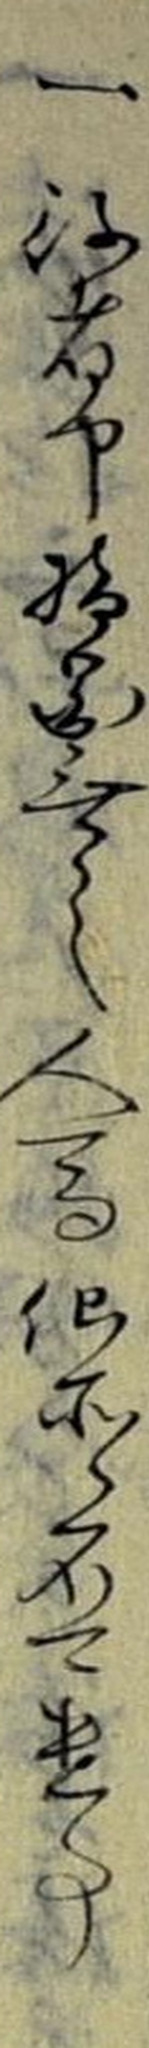一役者中指図無之人馬他所へ不可遣事
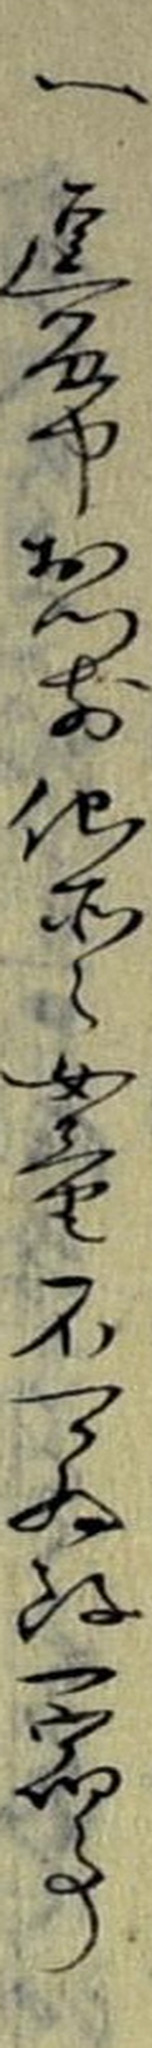一逗留中於門前他所之女童不可為致一宿事
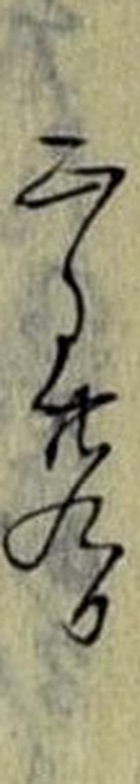正月廿九日
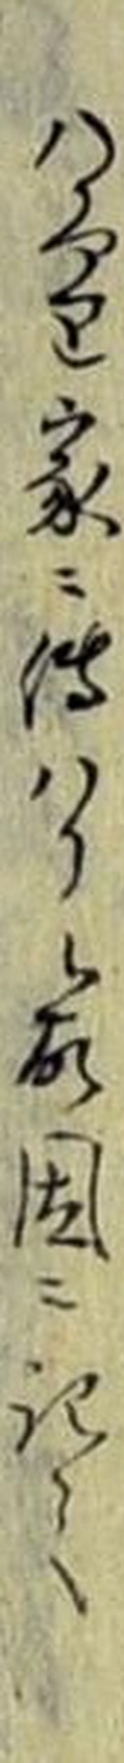覚八百里家ニ伝ハリ候故因ニ記之
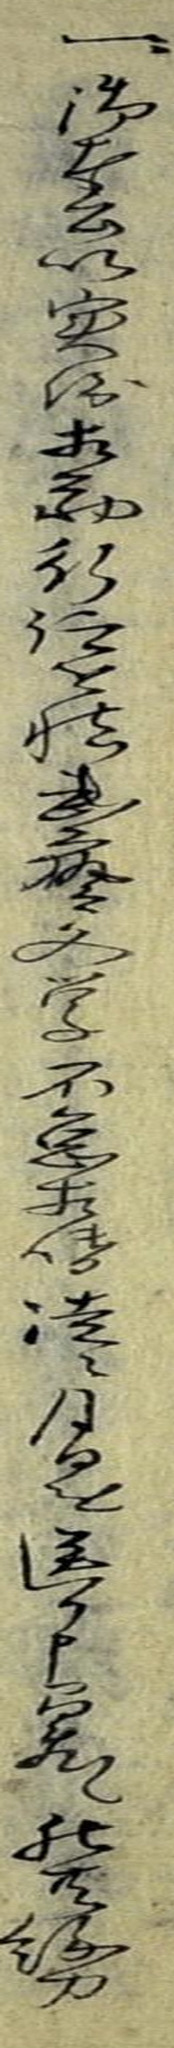一御奉公為実儀相勤行跡を慎武芸文学不怠相嗜徒ニ月日を送り申間敷候然共余力
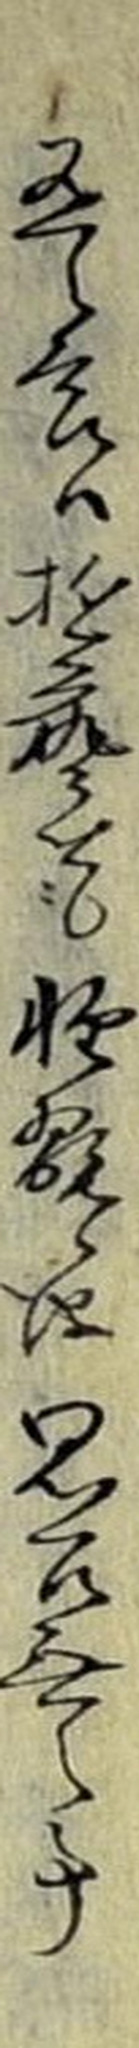有之節ハ遊芸をも軽翫候儀思召無之事
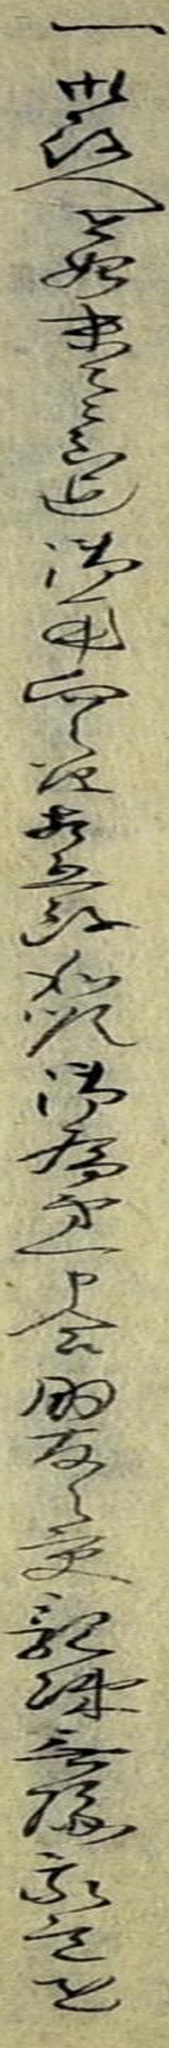一御役人を始末々ニ至迄御用向之儀相互致和順御為第一申合朋友之吏親疎無隔我意を
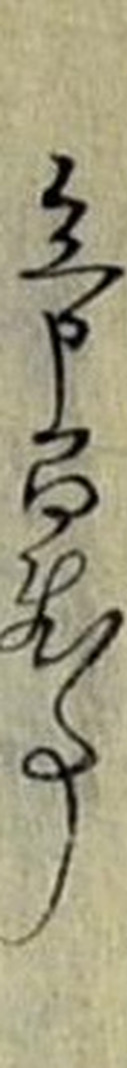立申間敷事
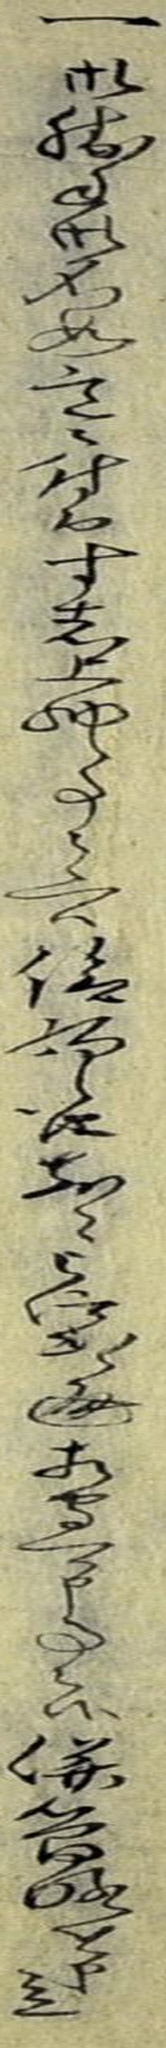一御勝手御不如意ニ付而寸志上納之事ニ候ヘハ倹約之儀前々被仰出候通相守可申事ニ候併簡略と申立
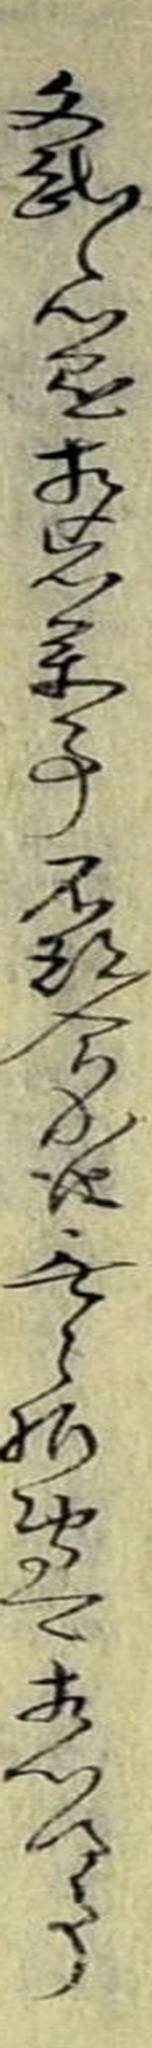文武之心懸相忘万事不都合成儀無之様専可相心得事
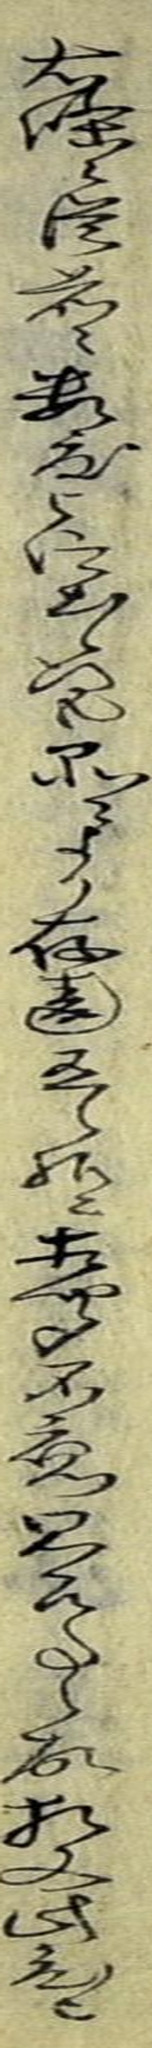右条々従前々数度被仰出候得共品ニより存違有之様ニ相聞不応思召事之故猶又此度被
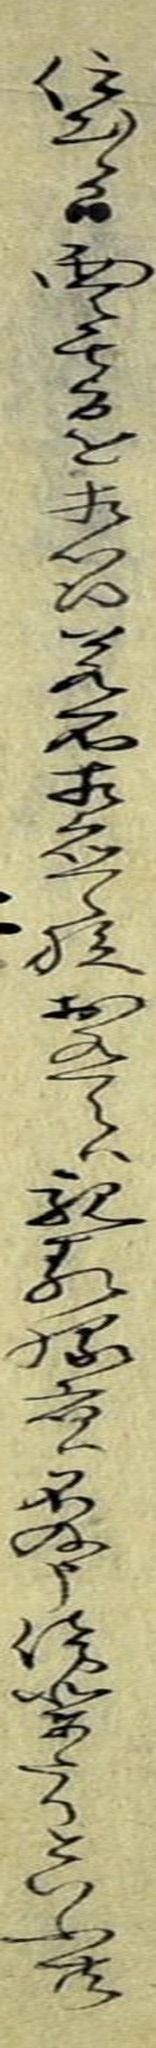仰出候間面々其旨を相心得若不相応之族於有之ハ親類縁者ハ不及申傍輩たりといふ共
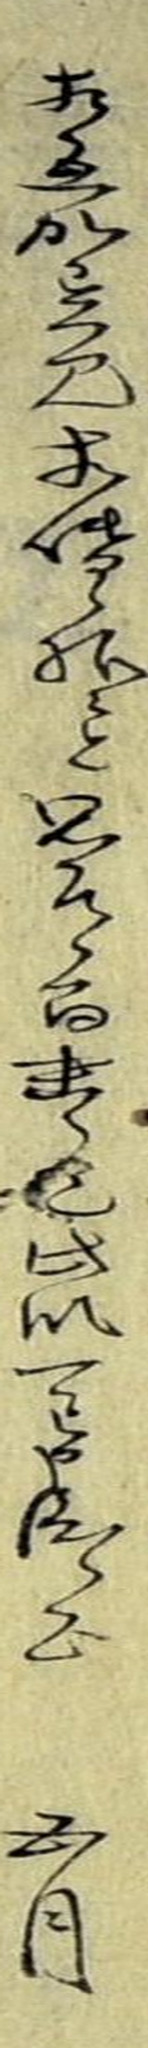相互加異見相嗜候様ニと思召候間末々迄此段可被申渡候以上五月

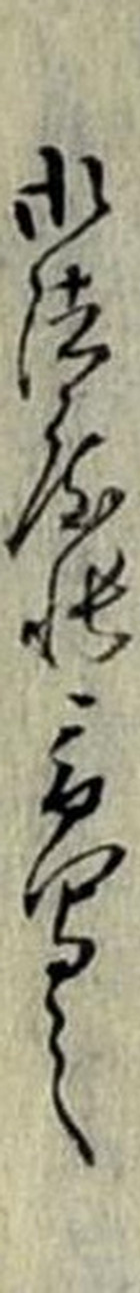御法度帳ニ而写之
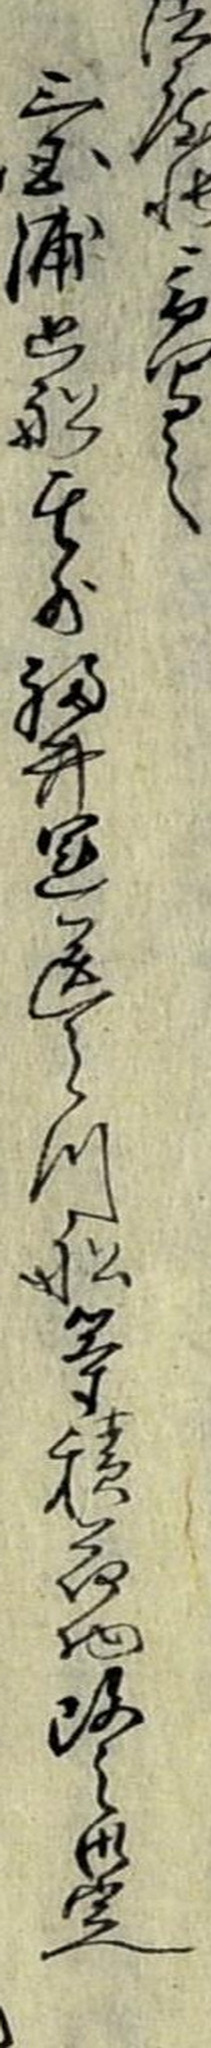三国浦廻船其外福井運送之川船等積荷物改之御定
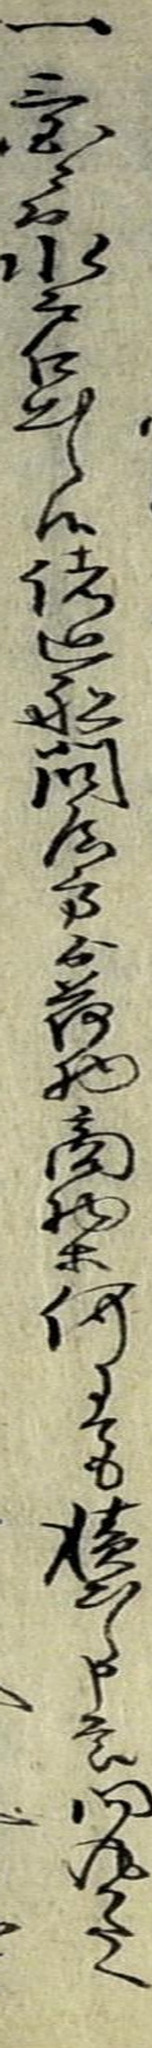一三国ニ而水戸口出し候諸廻船問屋方ゟ荷物商物等何にても積出し申節問丸かたへ
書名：命令之部 一
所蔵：福井県文書館 Fukui Prefectural Archives
